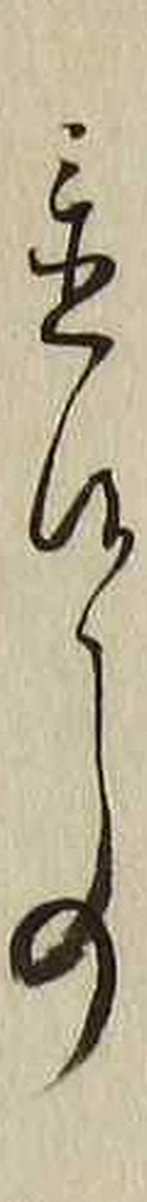置候事
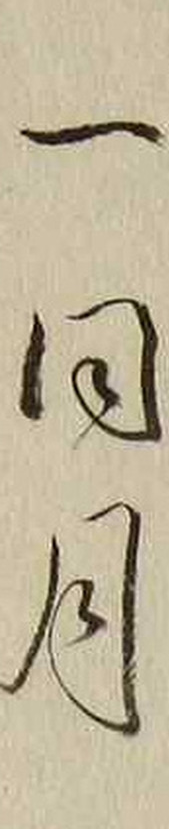一同月
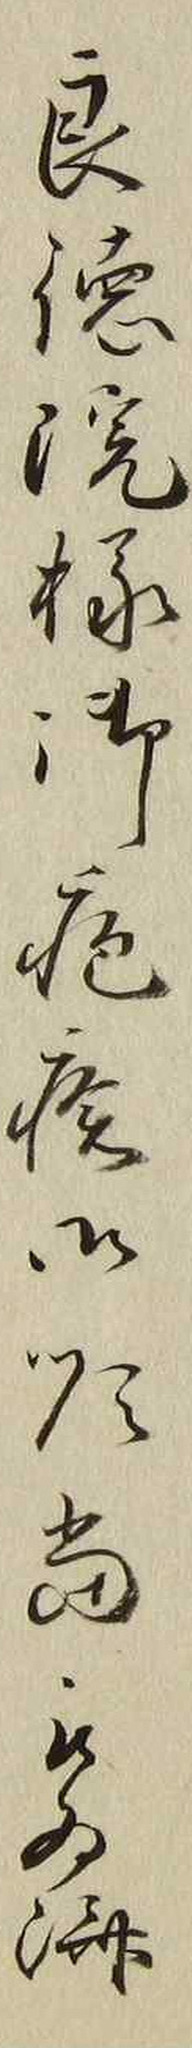良徳院様御疱瘡御順当被為済
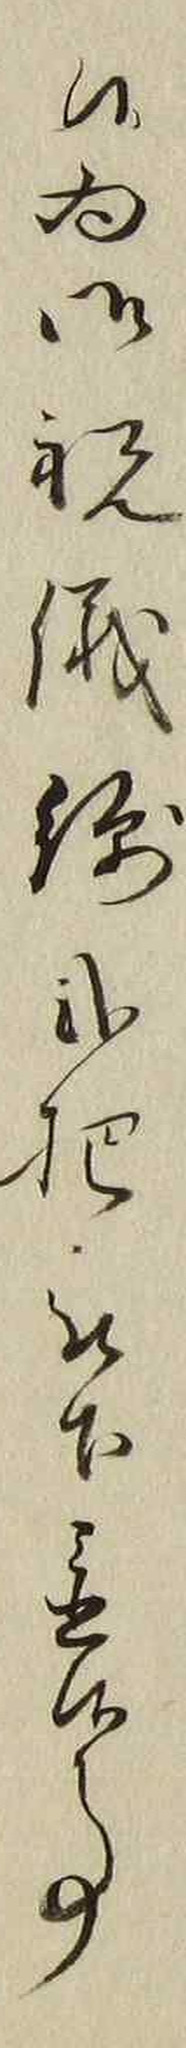候為御祝儀綿弐把被下置候事
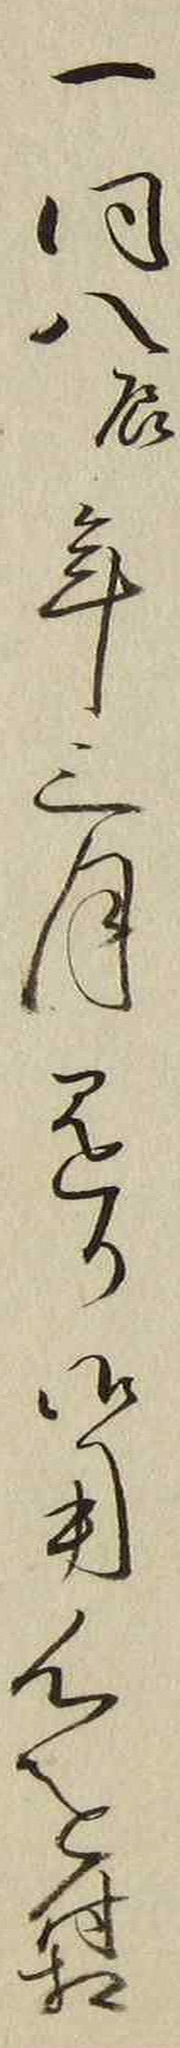一同八辰年三月懸り御用心を付相
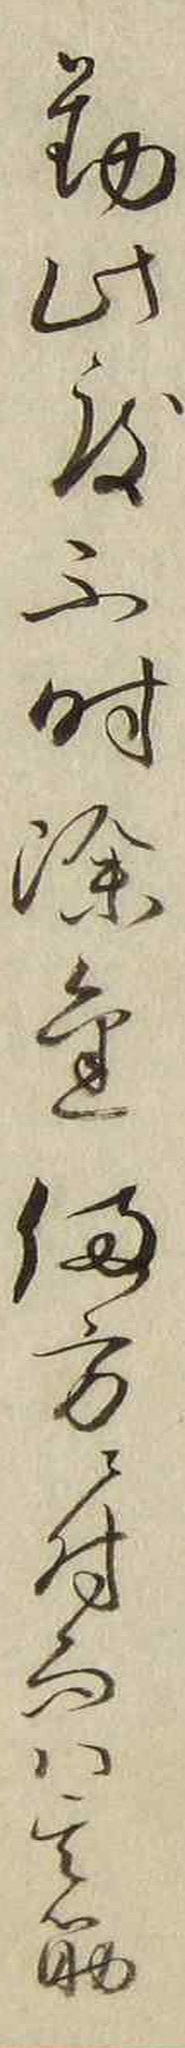勤此度不時除金備方ニ付而ハ其筋

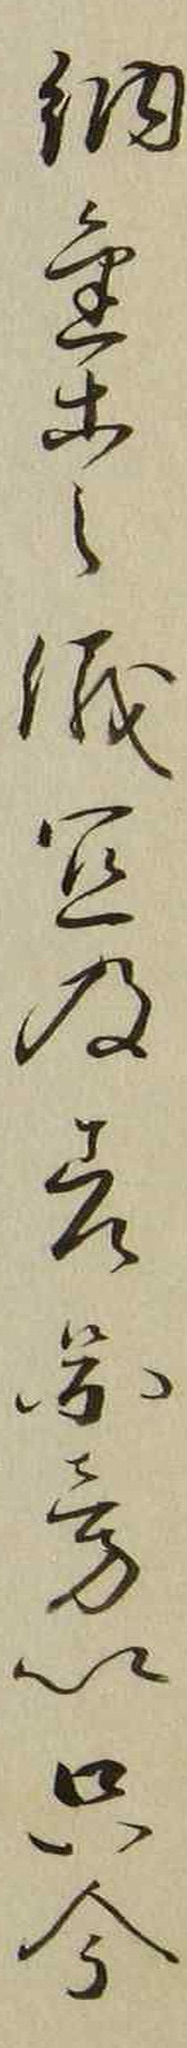納金等之儀宜及差図旁以只今
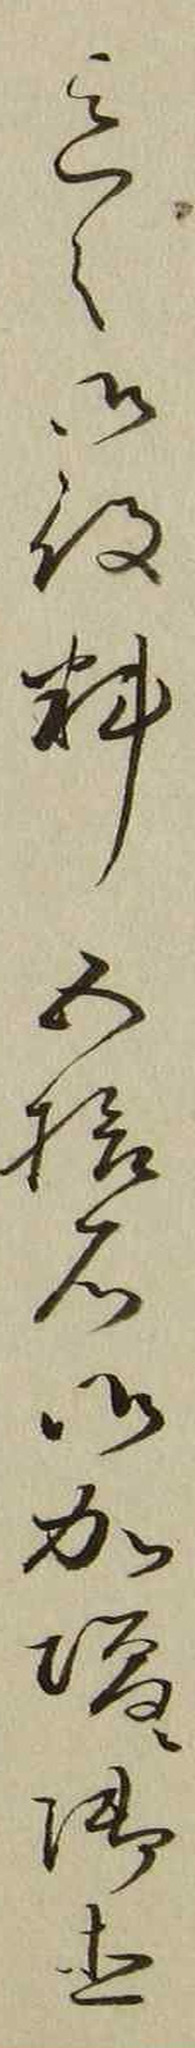迄之御役料五拾石御加増ニ御直
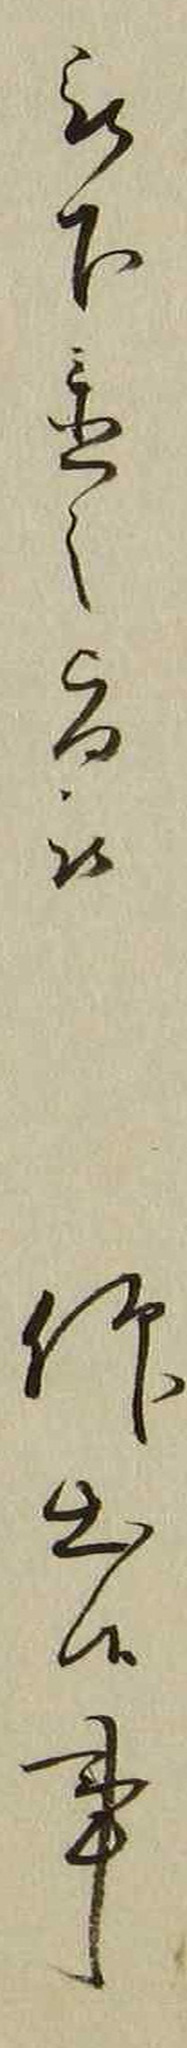被下置之旨被仰出候事
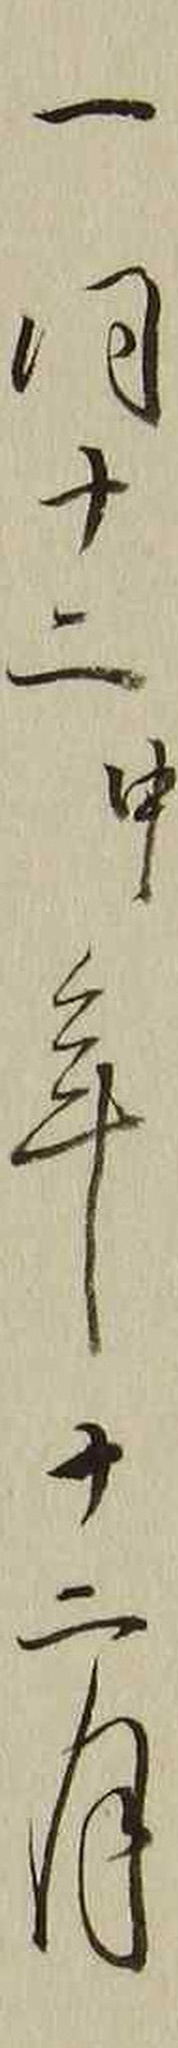一同十二申年十二月
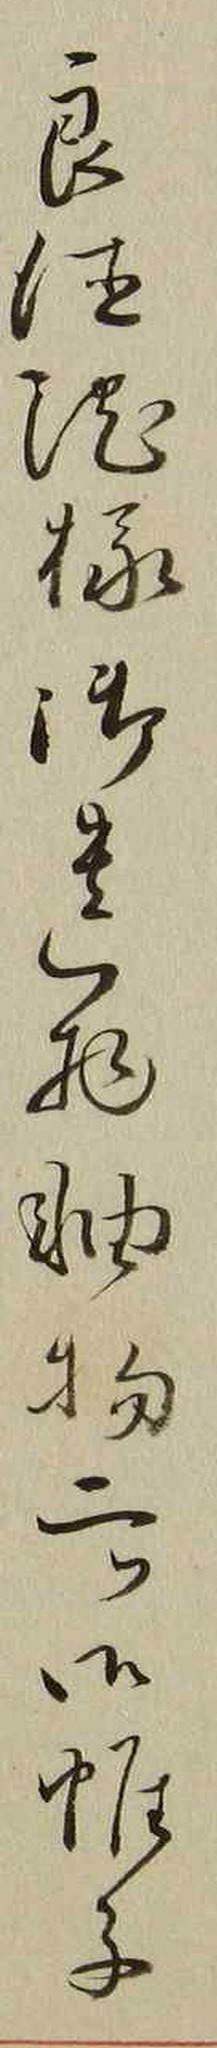良徳院様御遺物軸物二ツ御帷子
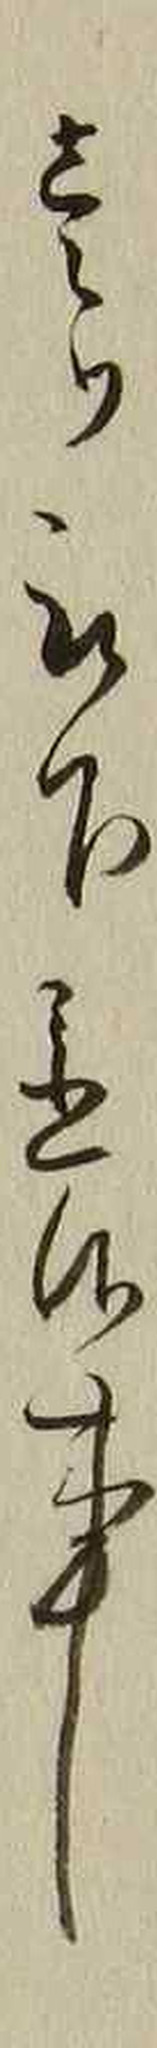壱ツ被下置候事
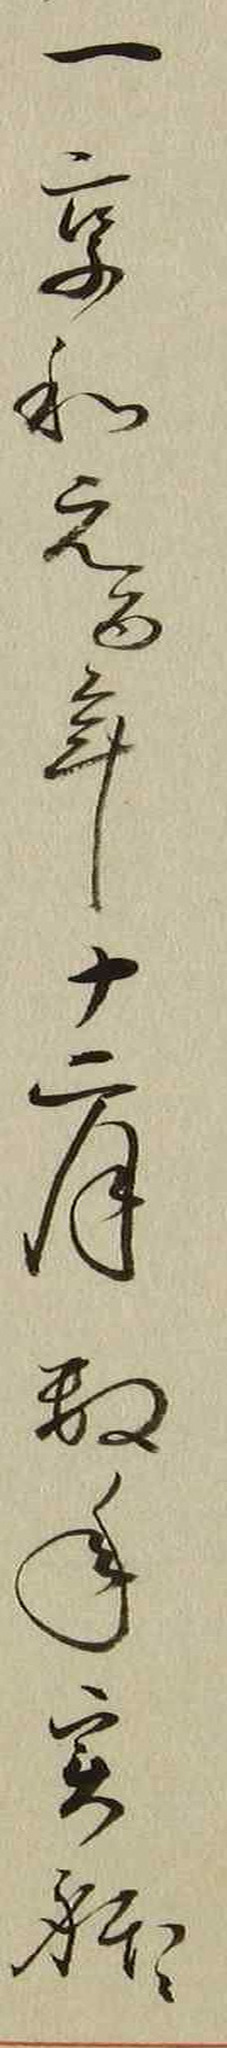一享和元酉年十二月数年実体ニ
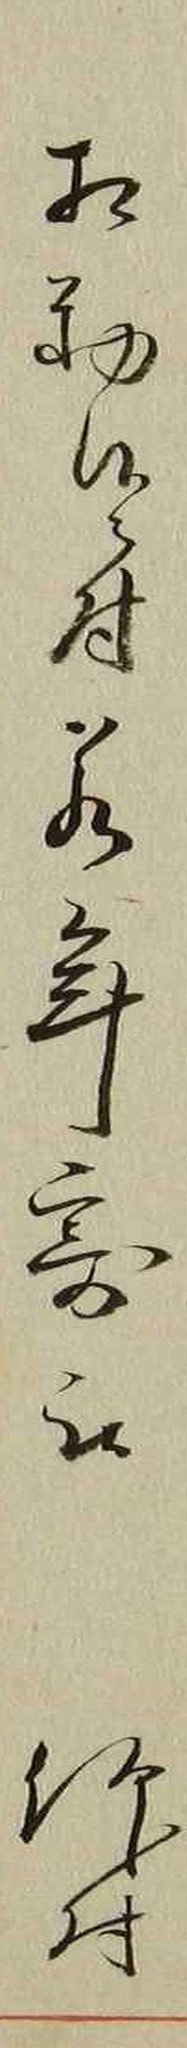相勤候ニ付若年寄被仰付
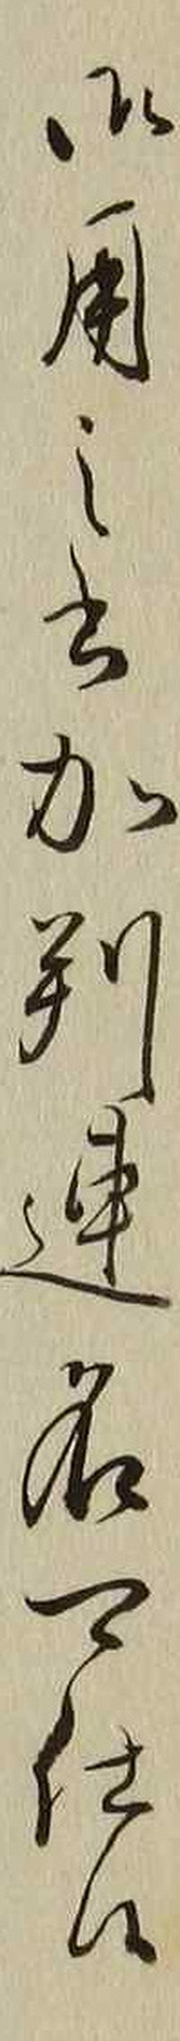御用之書加判連名可仕候
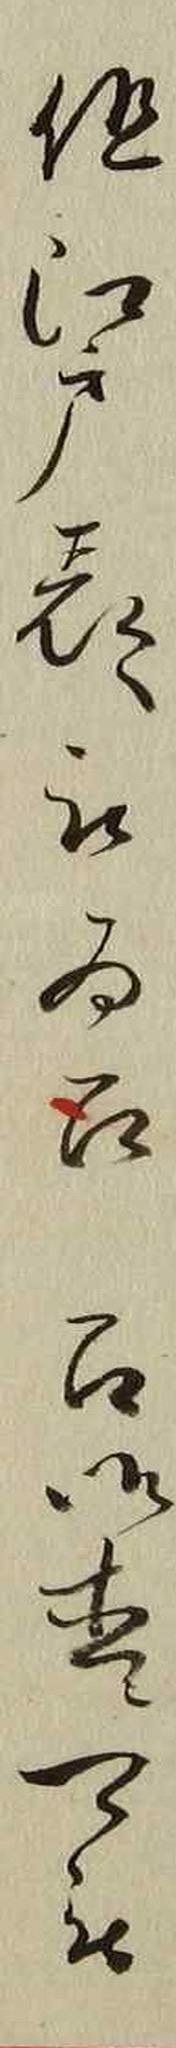但江戸表へ被為召御直ニ可被
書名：諸士系譜　巻之2　い之部2
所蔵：会津若松市立会津図書館
